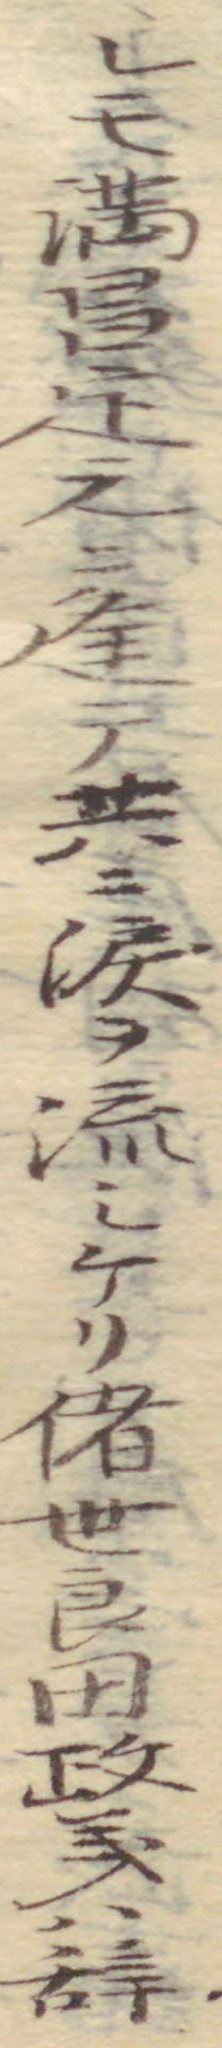レモ満昌定元ニ逢テ共ニ涙ヲ流シケリ偖世良田政義ハ辞
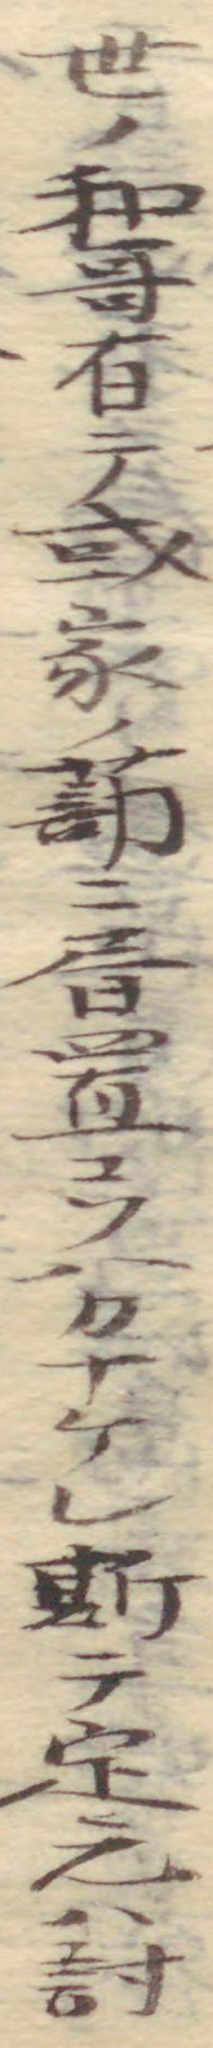世ノ和歌有テ或家ノ蔀ニ書置コソハカナケレ斯テ定元ハ討
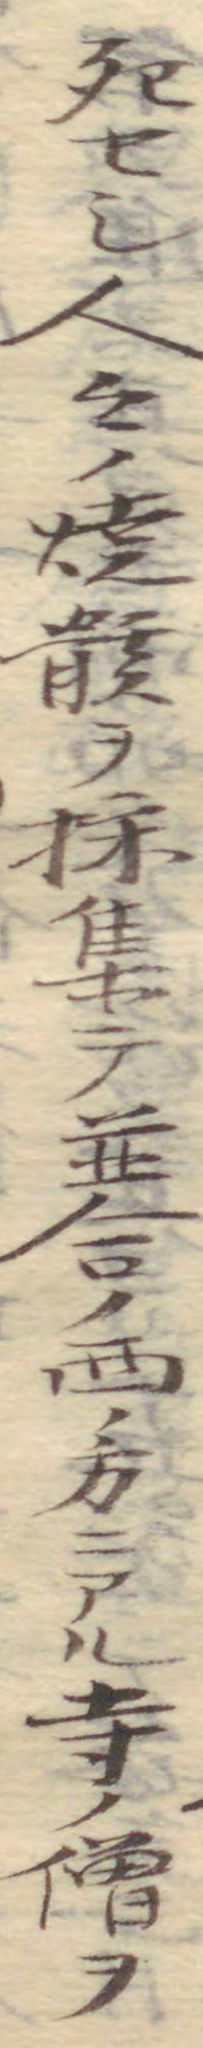死セシ人々ノ焼骸ヲ採集テ並合ノ西ノ方ニアル寺ノ僧ヲ
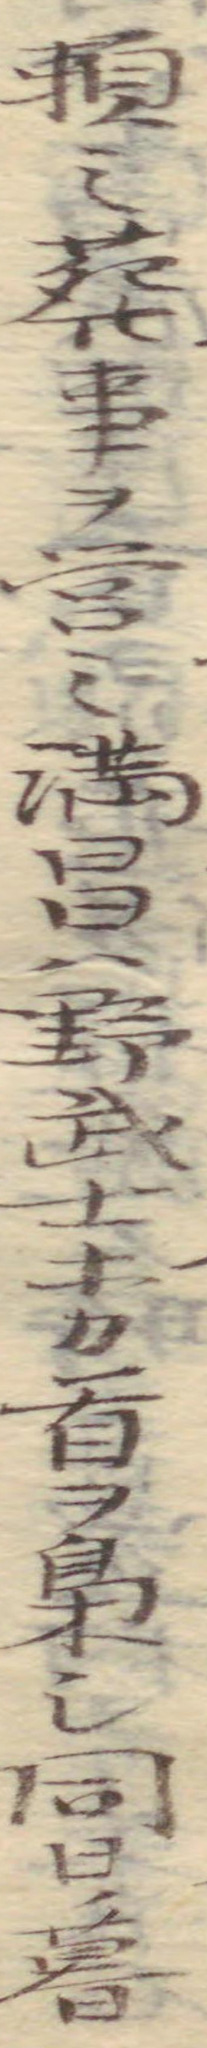頼ミ葬事ヲ営ミ満昌ハ野武士等カ首ヲ梟シ同日ノ暮
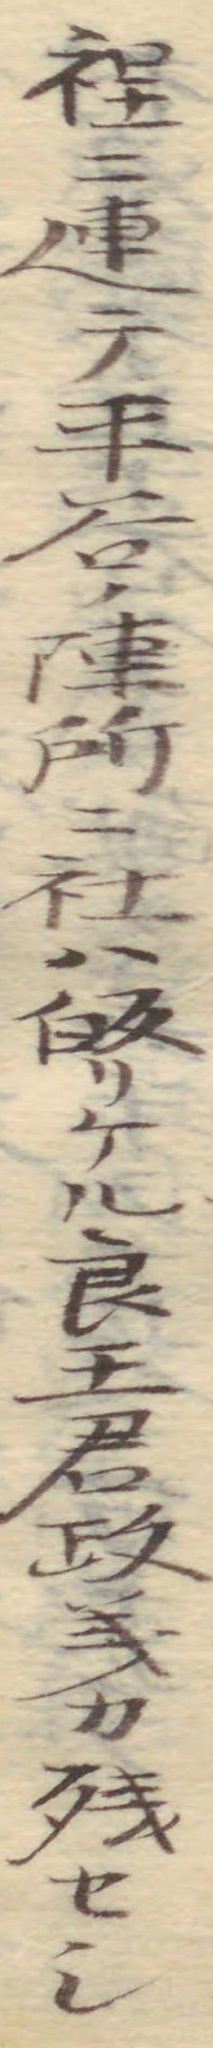程ニ連テ平谷ノ陣所ニ社ハ帰リケル良王君政義カ残セシ
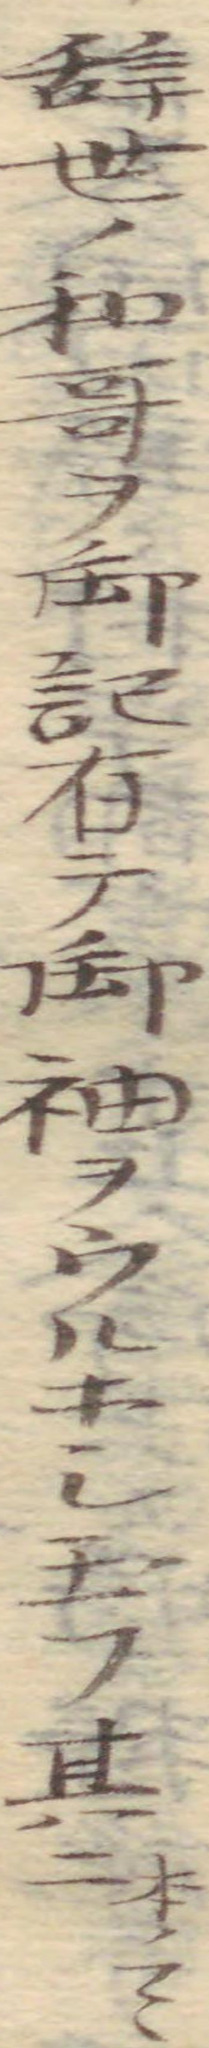辞世ノ和歌ヲ御記有テ御袖ヲウルホシ玉フ其ニ
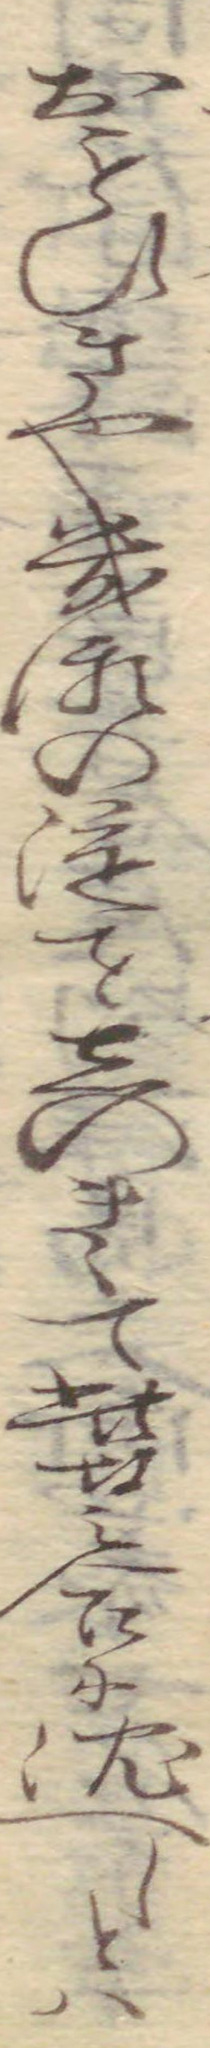おもひきや幾瀬の淀をしのきゝて此なみ合に沈へしとは
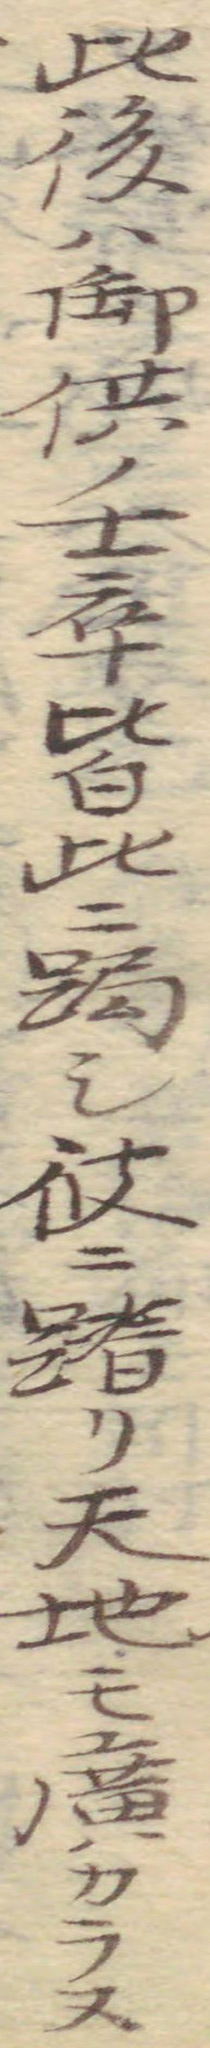此後ハ御供ノ士卒皆此ニ跼シ彼ニ蹐リ天地モ広カラヌ
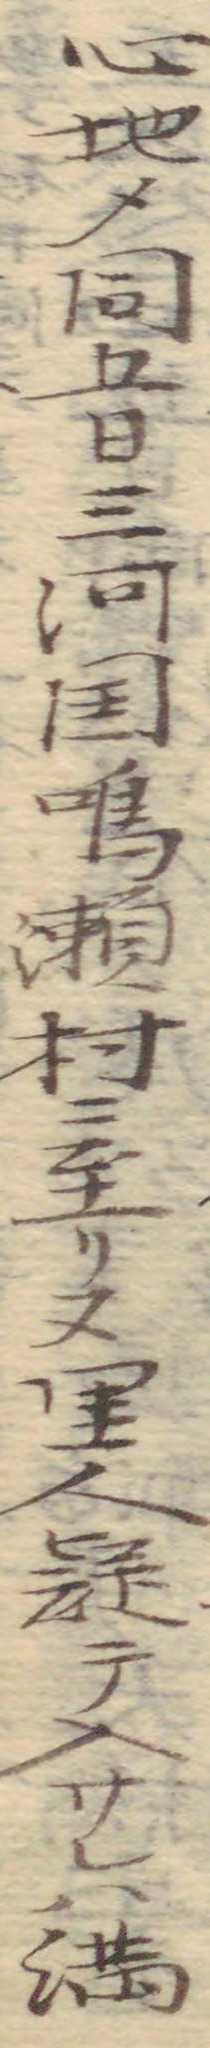心地シテ同五日三河国鳴瀬村ニ至リ又里人疑テ入サレハ満

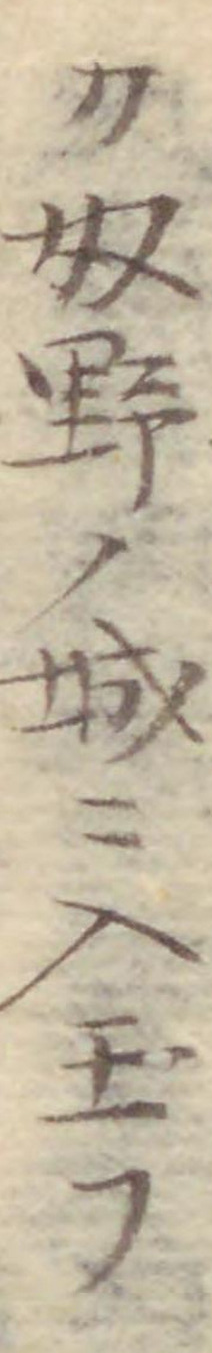カ奴野ノ城ニ入玉フ
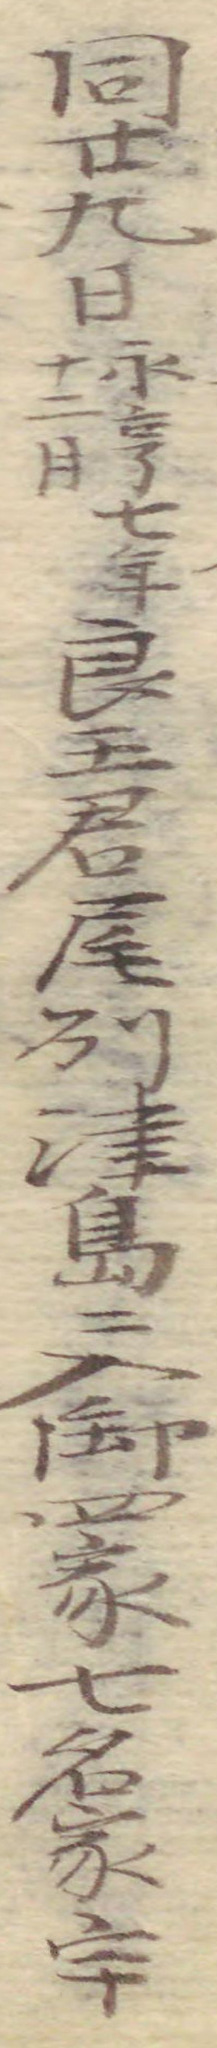同廿九日永亨七年十二月良王君尾州津島ニ入御四家七名家宇
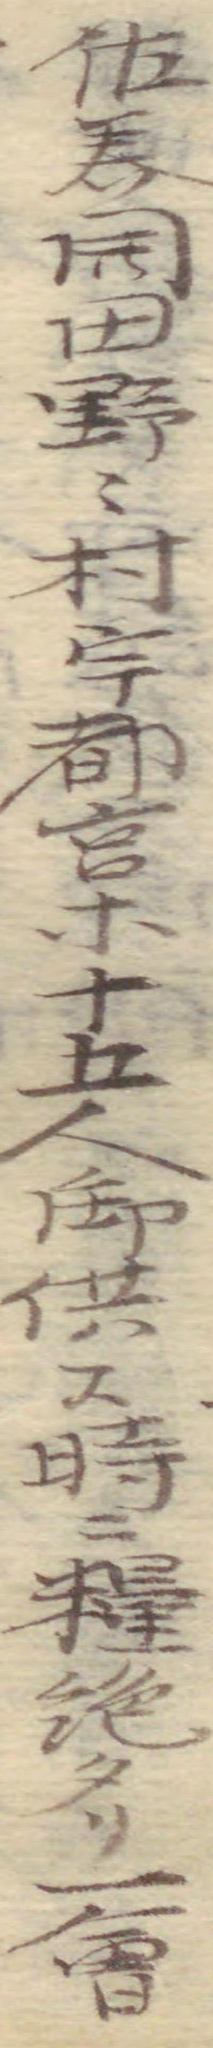佐美開田野々村宇都宮等十五人御供ス時ニ糧絶タリ一会
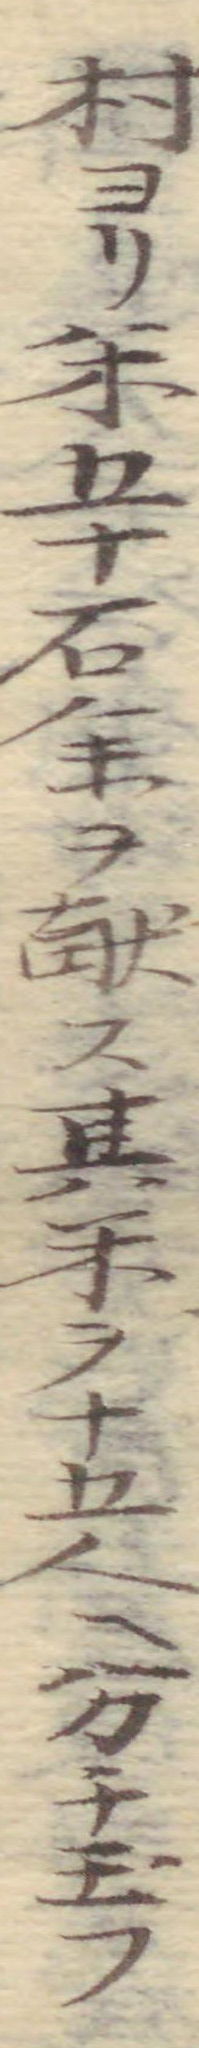村ヨリ米五十石余ヲ献ス其米ヲ十五人ヘ分チ玉フ
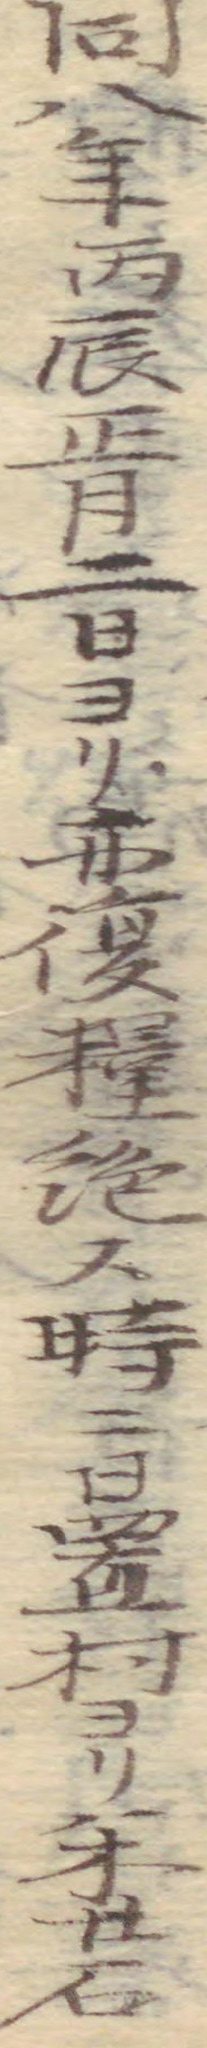同八年丙辰正月二日ヨリ亦復糧絶ス時ニ日置村ヨリ米廿石
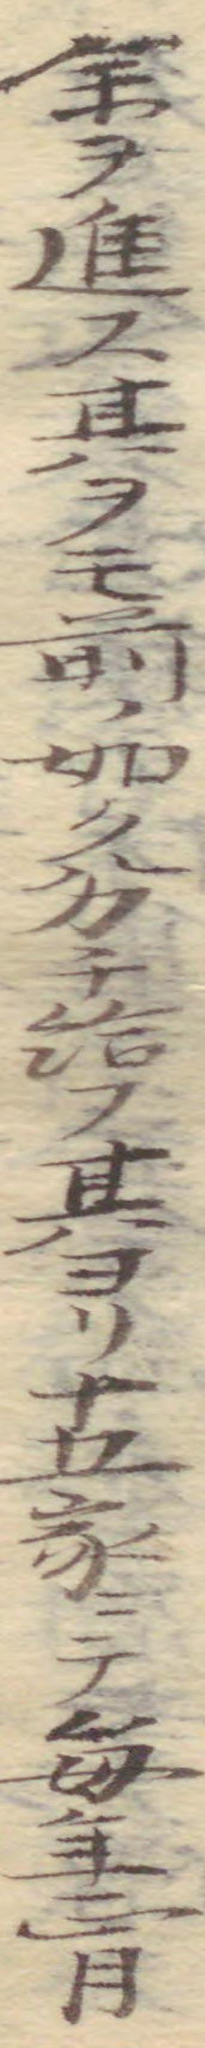余ヲ進ス其ヲモ前ノ如ク分チ給フ其ヨリ十五家ニテ毎年正月
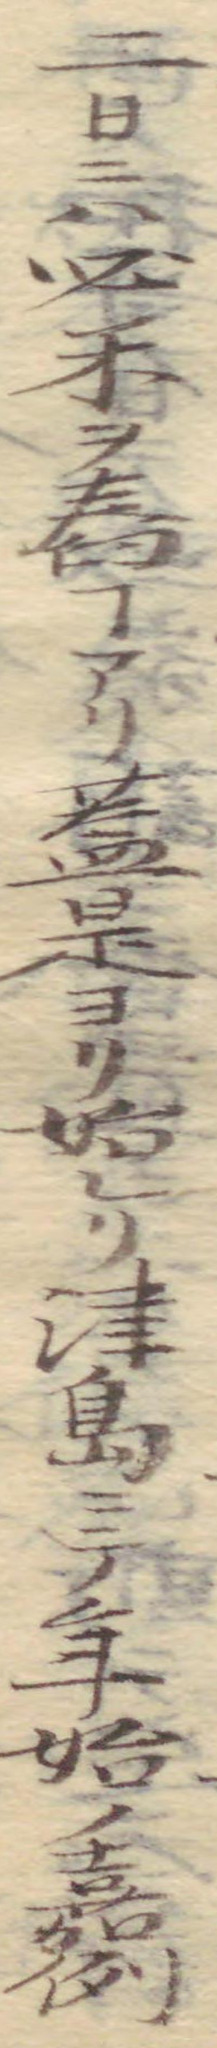二日ニハ必米ヲ舂コトアリ蓋是ヨリ始レリ津島ニテ年始ノ嘉例
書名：鶯宿雑記. 巻199-200
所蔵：国立国会図書館 National Diet Library, JAPAN
